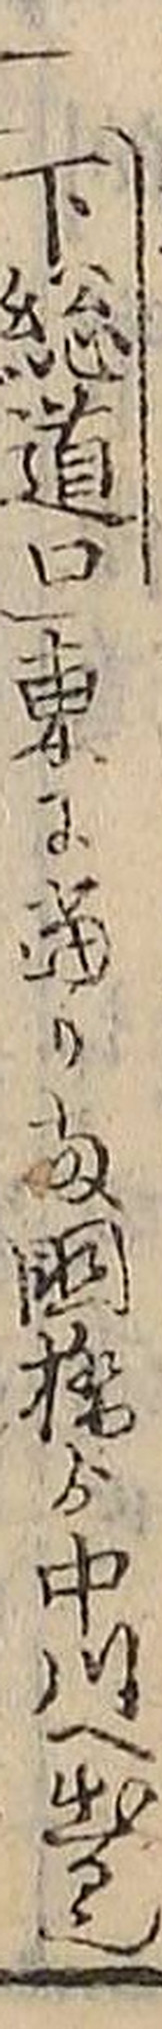一下総道口東に当り両国橋ゟ中川へ出る也
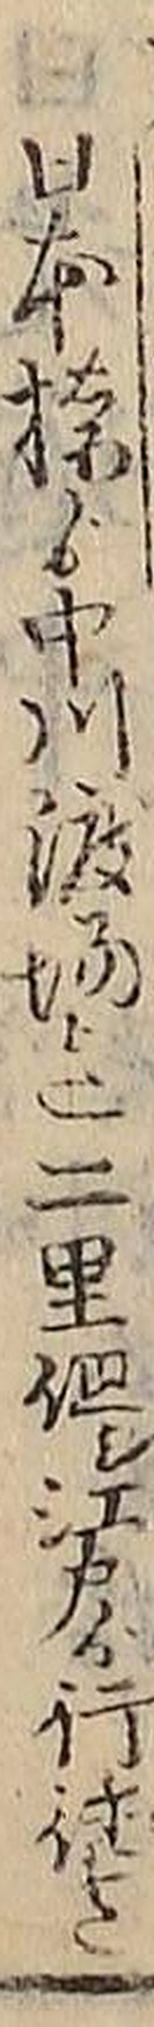日本橋ゟ中川渡場迄二里但江戸ゟ行徳迄
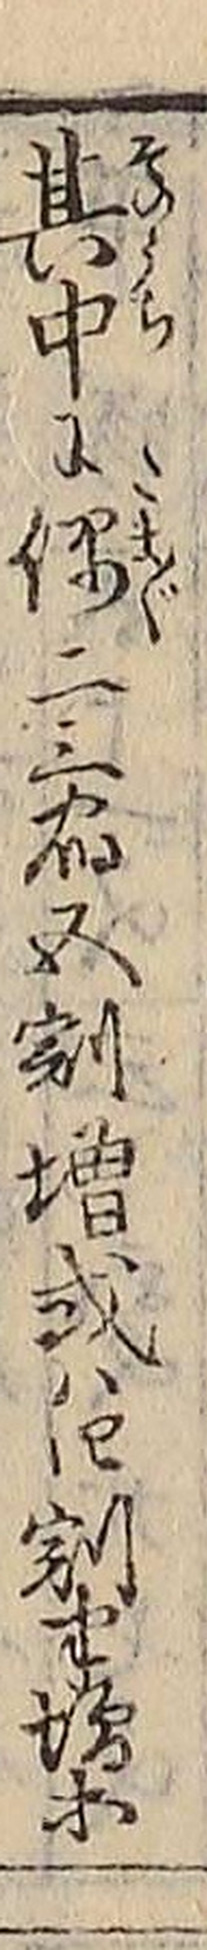其中に縷二三宿五割増或は四割半増等
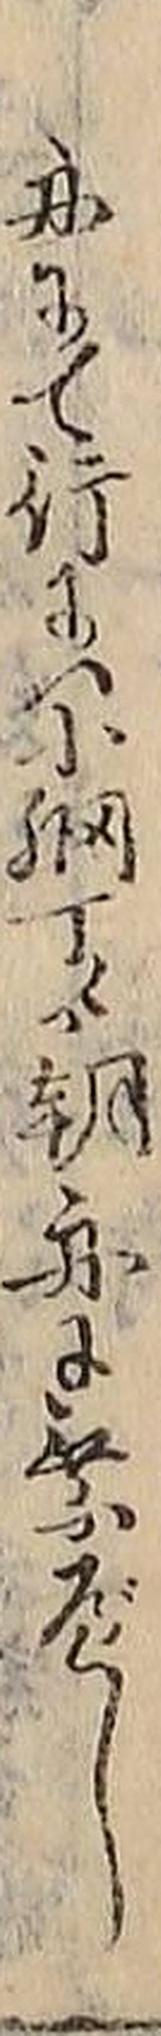舟にて行には小網丁ゟ朝舟に乗べし
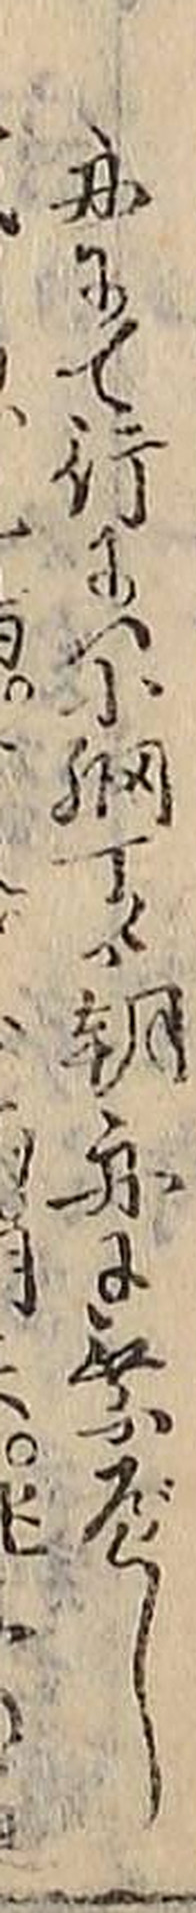舟にて行には小網丁ゟ朝舟に乗べし
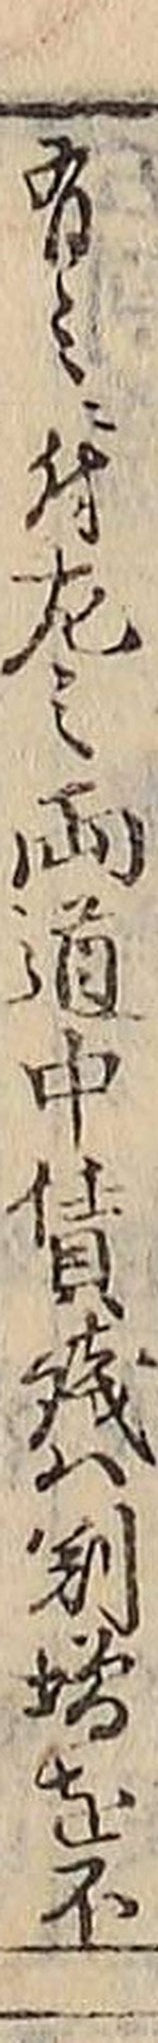有之付左之両道中賃銭は割増を不
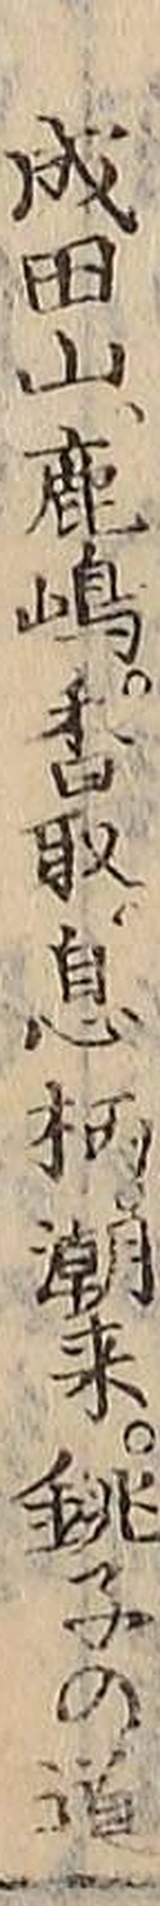成田山。鹿島。香取。息柄。潮来。銚子の強
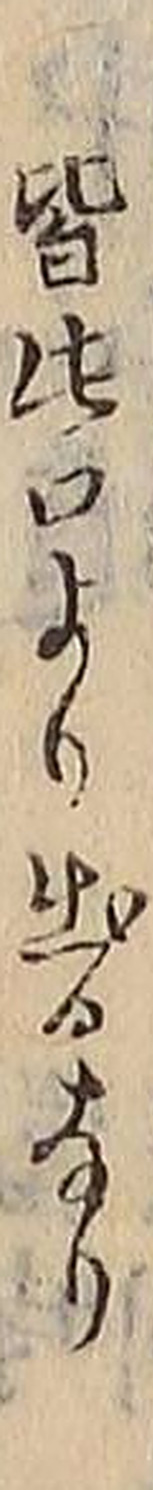皆比口より出るなり
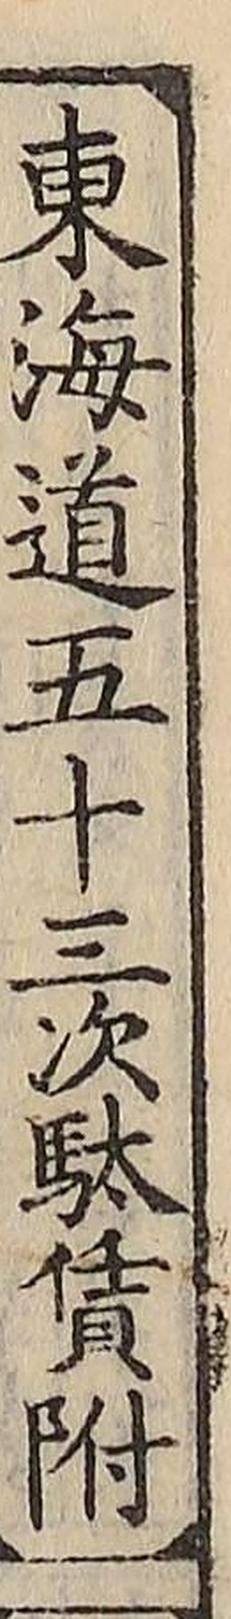東海道五十三次駄賃附
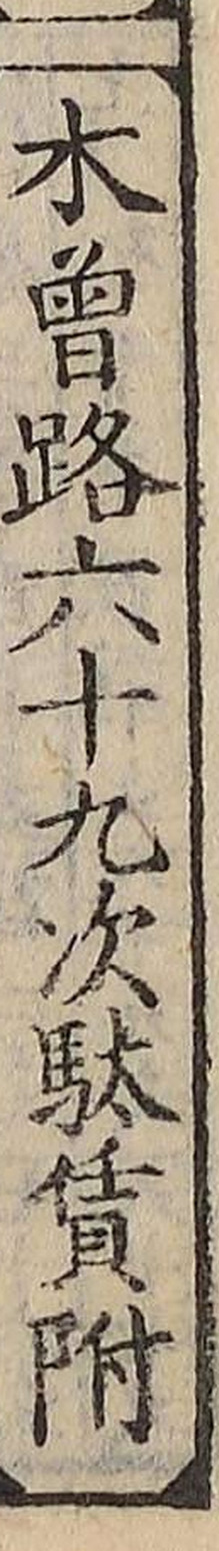木曽路六十九次駄賃附
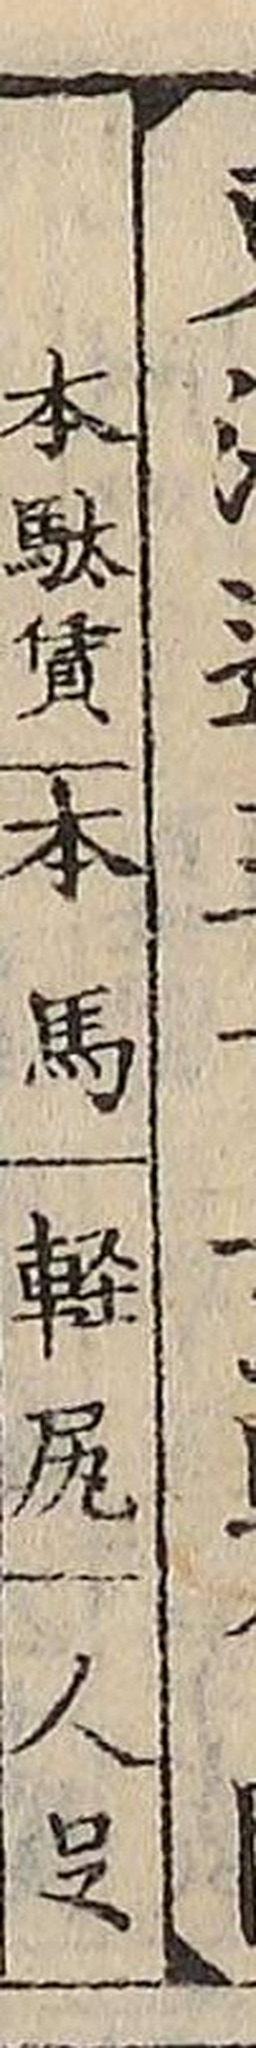本駄賃本馬軽尻人足
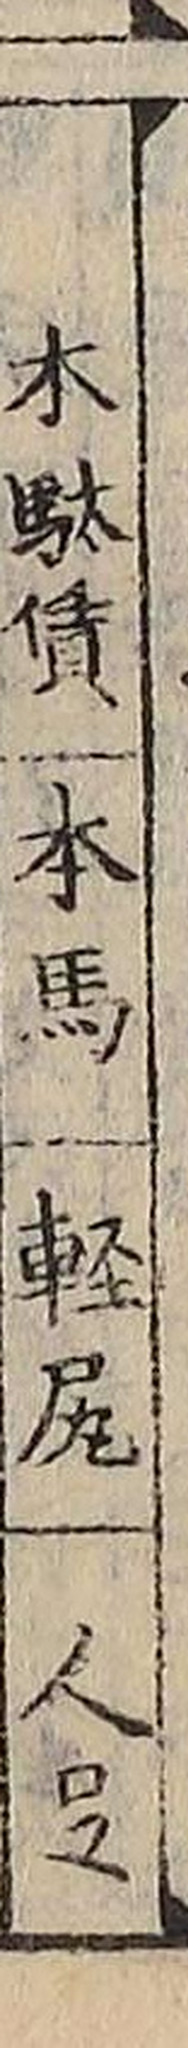木駄賃本馬軽尻人足
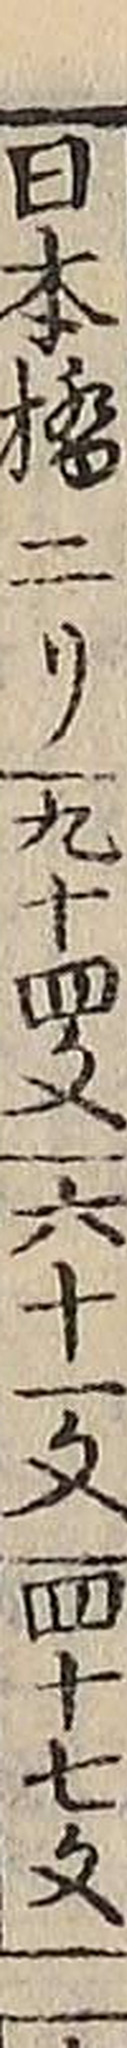日本橋二リ九十四文六十一文四十七文
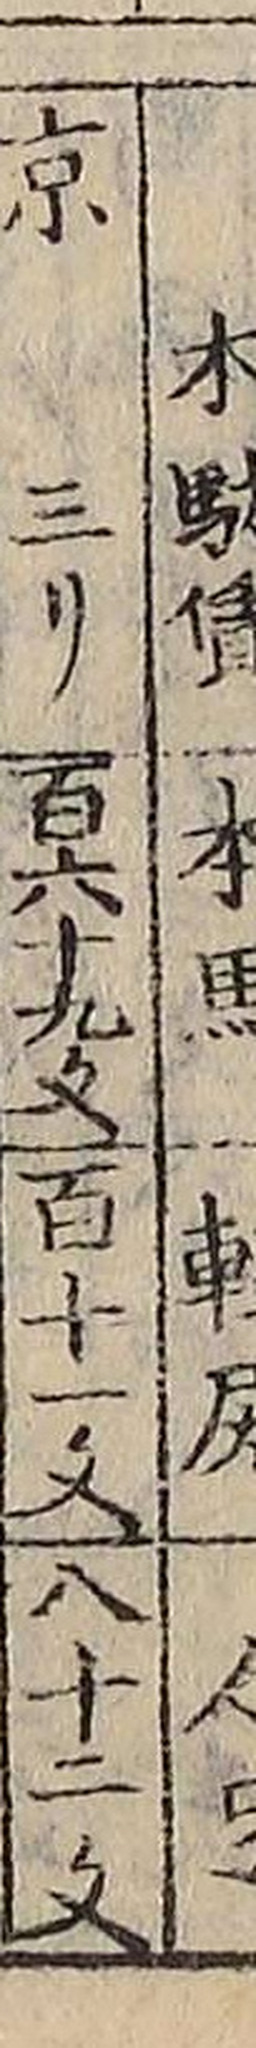京三リ百六十九文百十一文八十二文
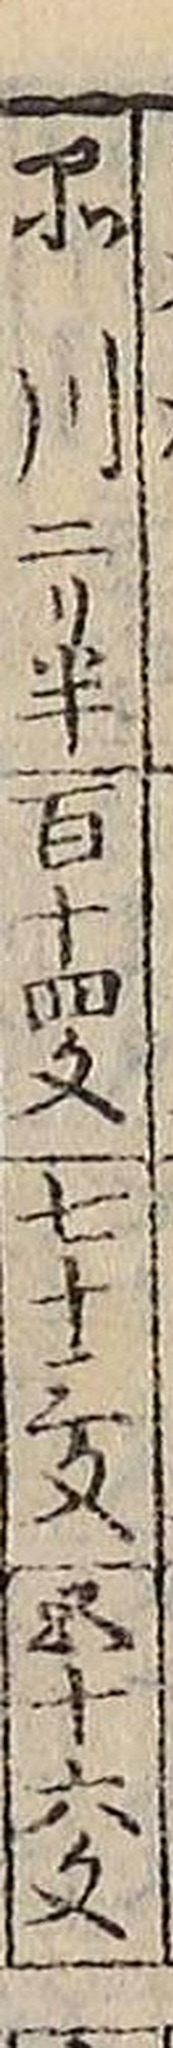品川二リ半百十四文七十三文五十六文
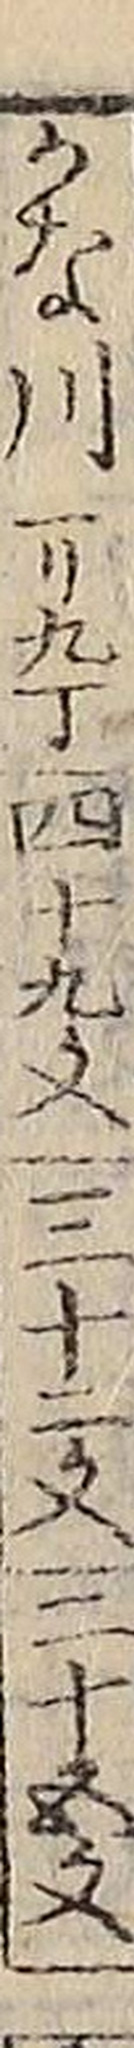かな川一リ九丁四十九文三十二文二十五文
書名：旅行用心集
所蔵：神戸大学附属図書館 国文学研究資料館
